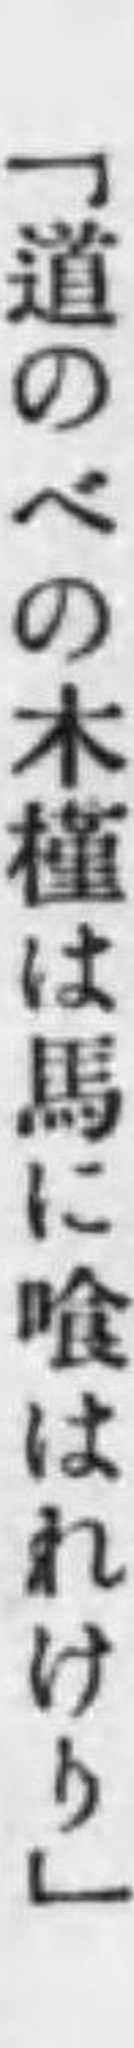「道のベの木槿は馬に喰はれけり」
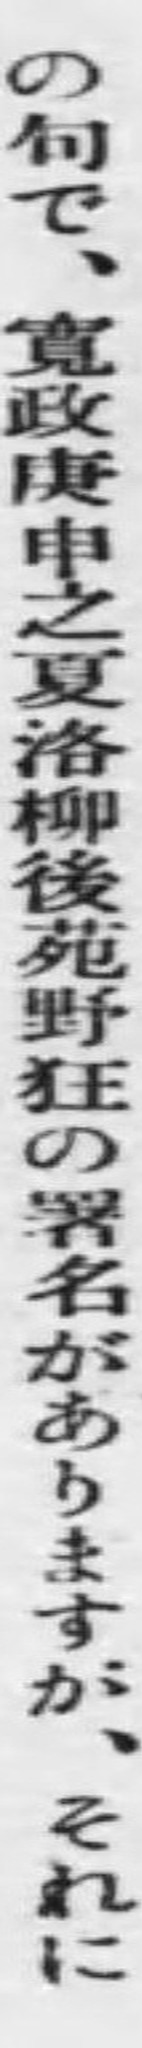の句で、寛政庚申之夏洛柳後苑野狂の署名がありますが、それに
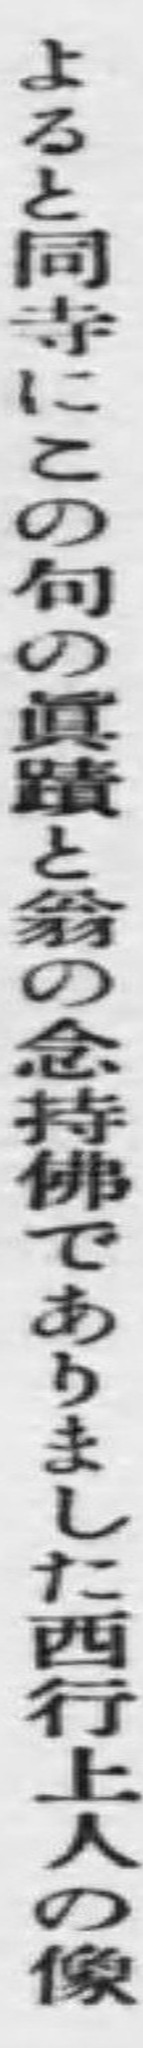よると同寺にこの句の真蹟と翁の念持仏でありました西行上人の像
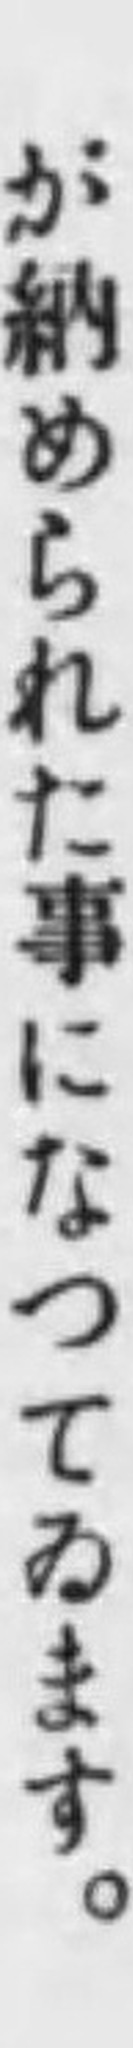が納められた事になつてゐます。
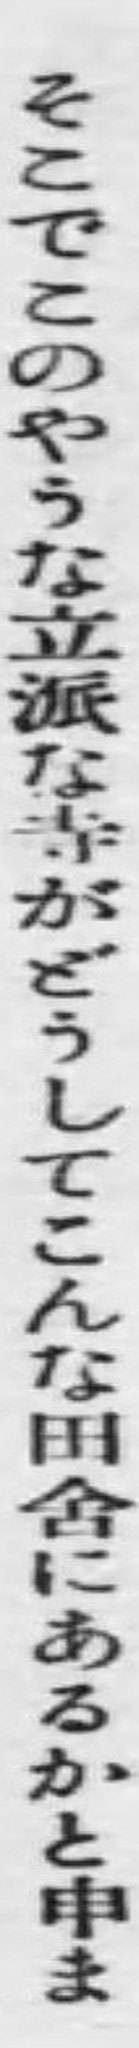そこでこのやうな立派な寺がどうしてこんな田舎にあるかと申ま
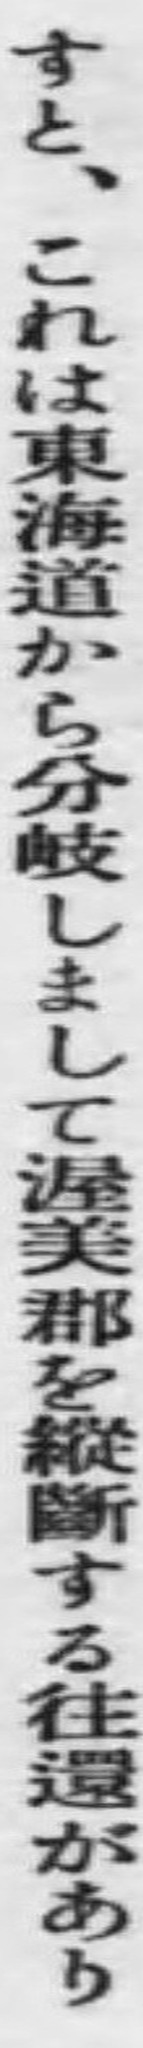すと、これは東海道から分岐しまして渥美郡を縦断する往還があり
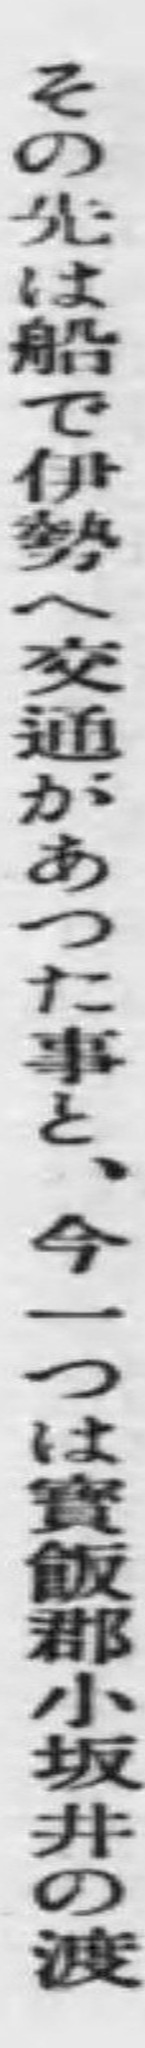その先は船で伊勢へ交通があつた事と、今一つは宝飯郡小坂井の渡
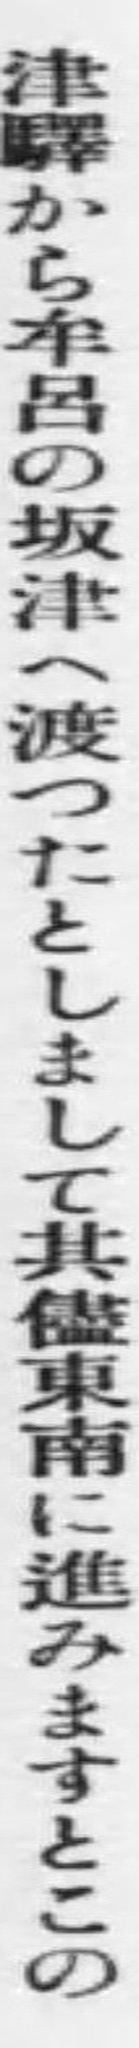津駅から牟呂の坂津へ渡つたとしまして其侭東南に進みますとこの
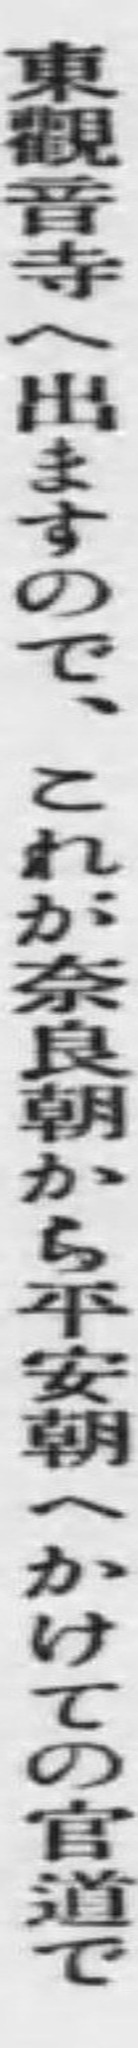東観音寺へ出ますので、これが奈良朝から平安朝へかけての官道で
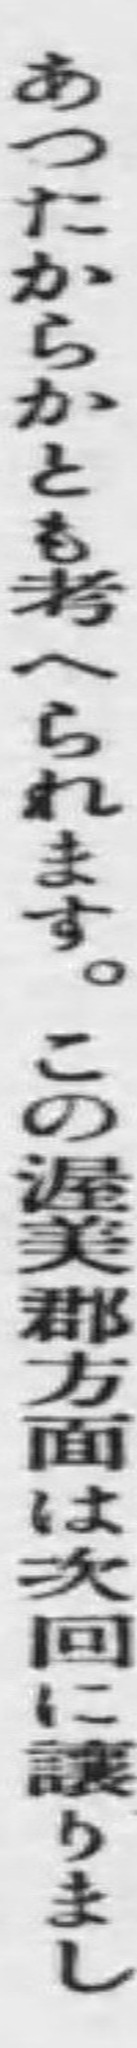あつたからかとも考へられます。この渥美郡方面は次回に譲りまし
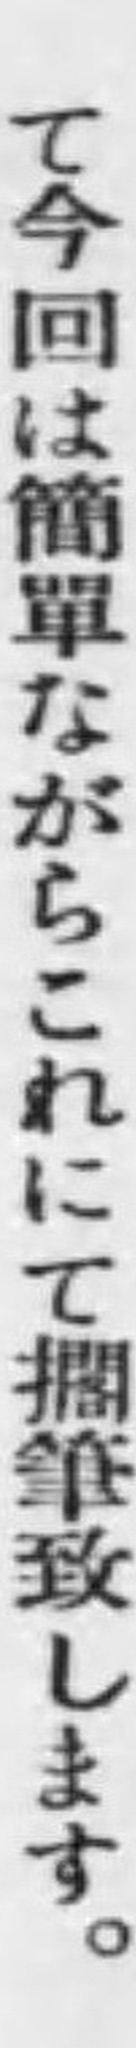て今回は簡単ながらこれにて擱筆致します。以上
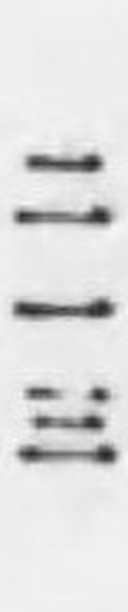二一三

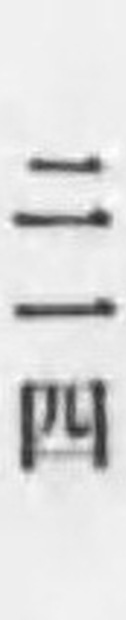二一四
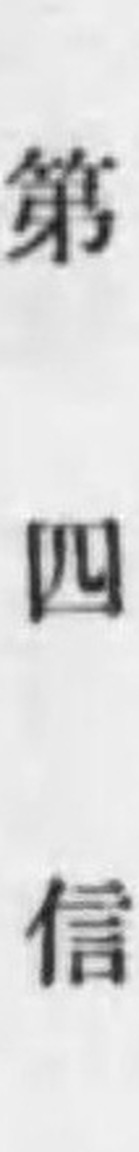第四信
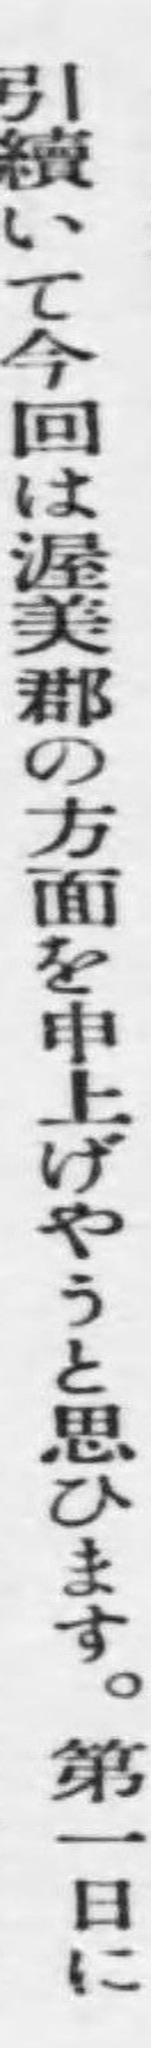引続いて今回は渥美郡の方面を申上げやうと思ひます。第一日に
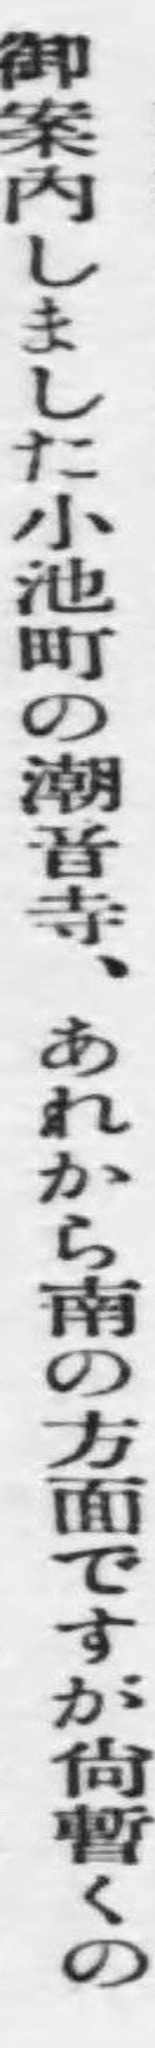御案内しました小池町の潮音寺、あれから南の方面ですが尚暫くの
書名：東三河道中記 : 豊橋市及其附近案内
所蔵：国立国会図書館 National Diet Library, JAPAN
